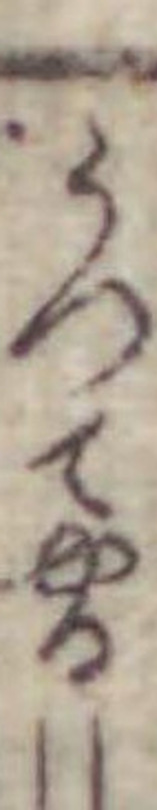うつてやる
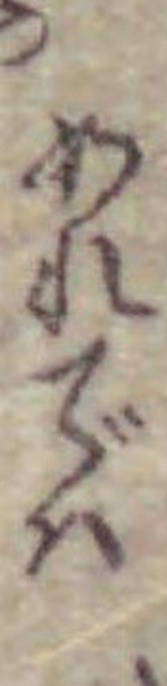あれでは
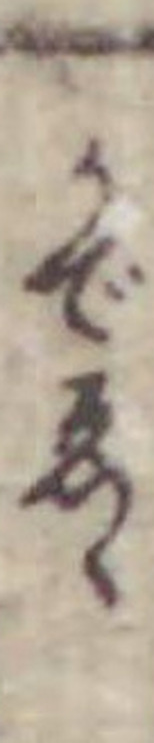かでゑゝ
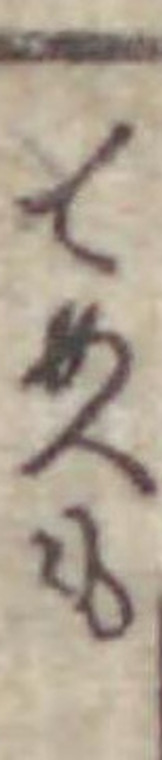てめへも
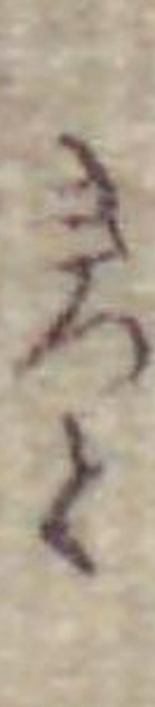きつと
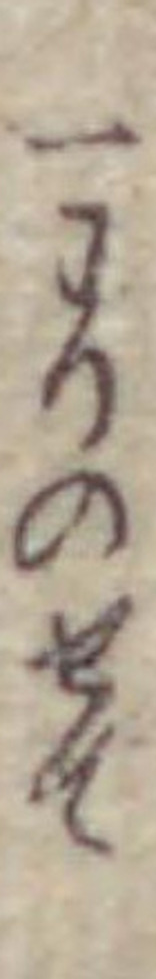一わりのせて
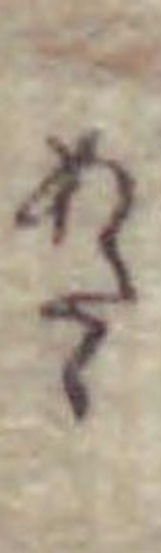あたゝ
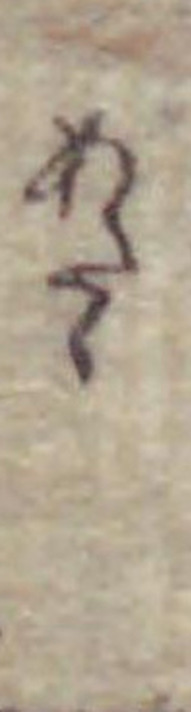あたゝ
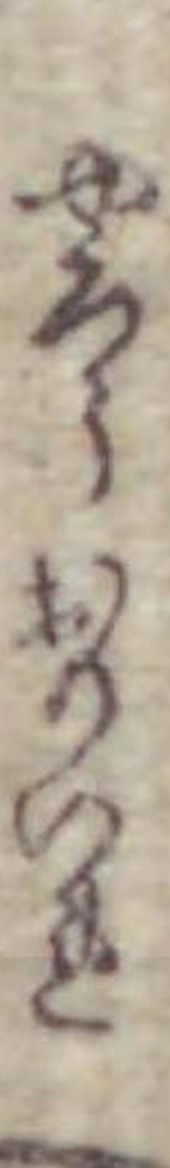やろうおりいれ
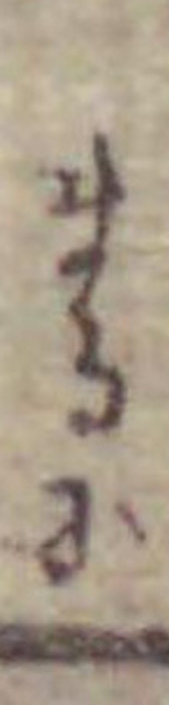まるに
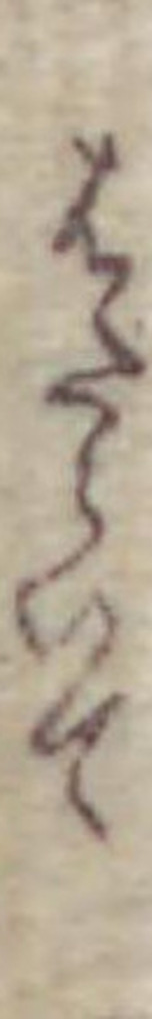はたらいて
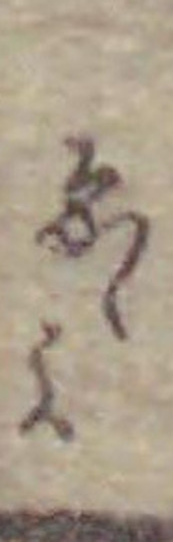ゑゝに
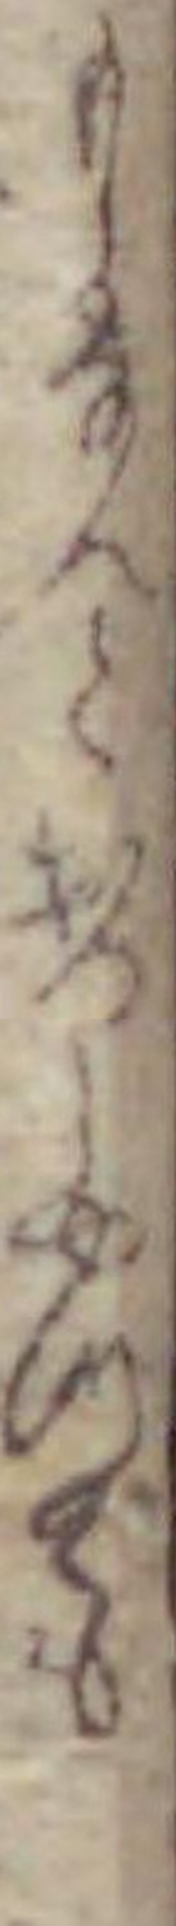もしなんとおつしやつても
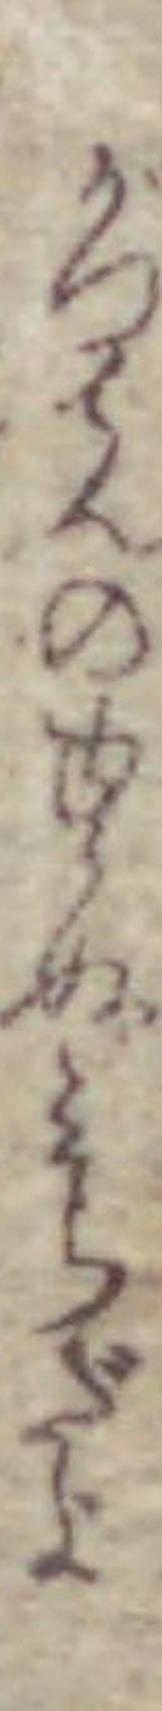がつてんのゆかぬみちだよ
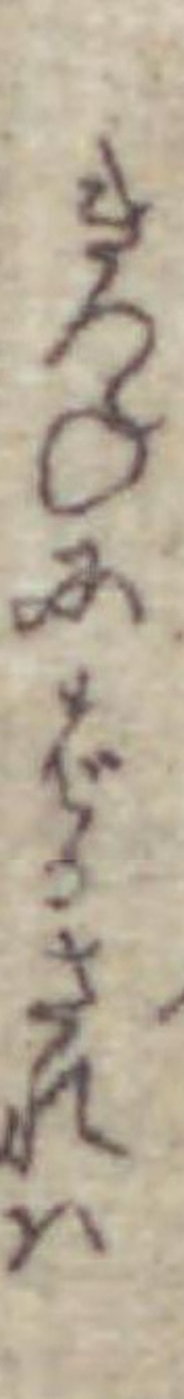きつねにばかされは
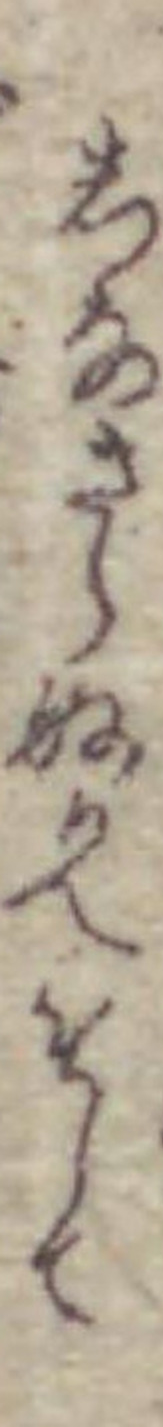しなさらぬかへそして
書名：嗚呼不侭世之助噺 : 3巻
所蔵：国立国会図書館 National Diet Library, JAPAN
